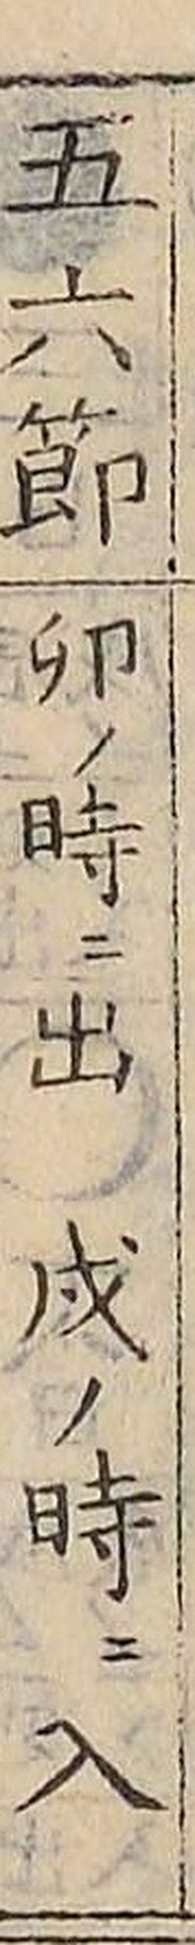五六節卯ノ時出戌ノ時入
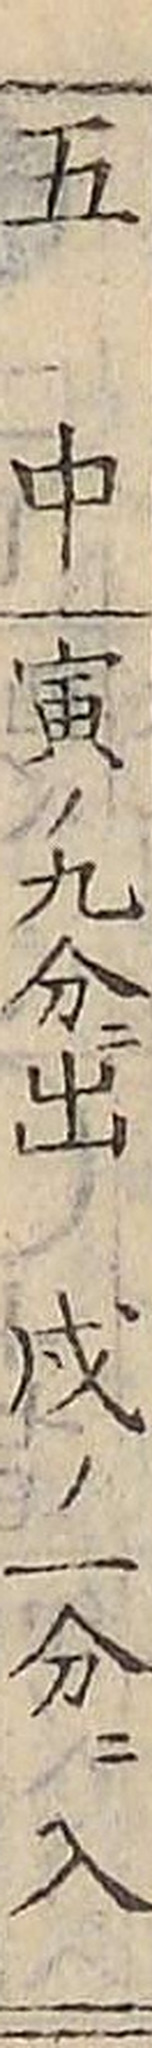五中寅ノ九分出戌ノ一分入
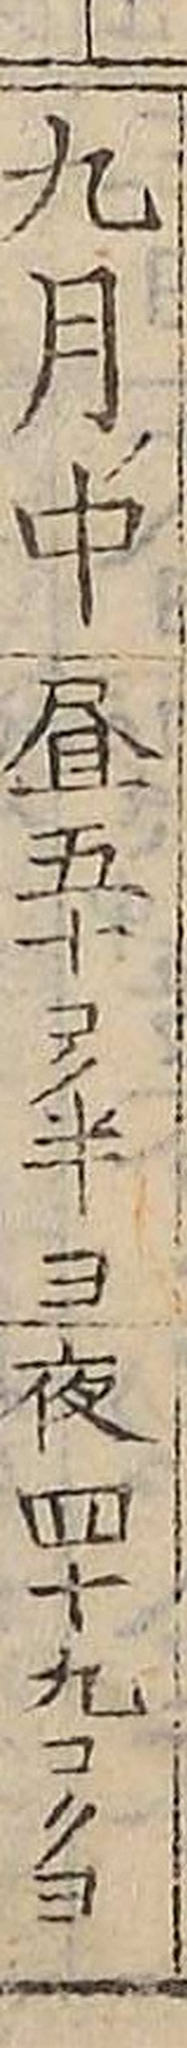九月中昼五十コク半ヨ夜四十九コクヨ
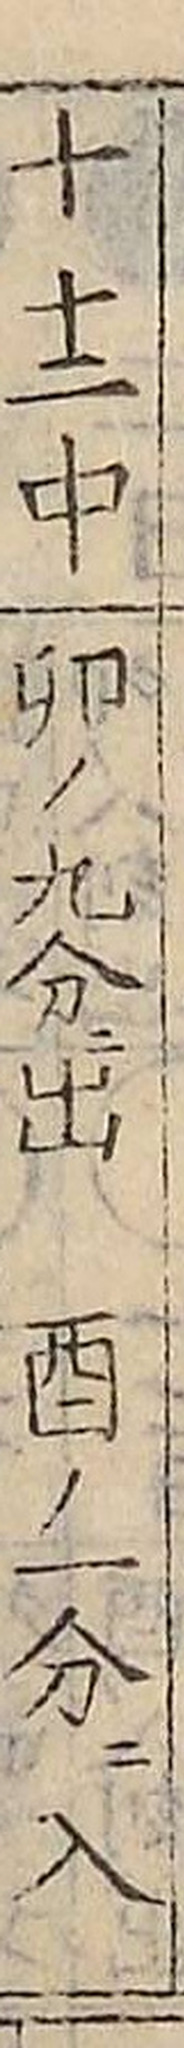十十二中卯ノ九分出酉ノ一分入
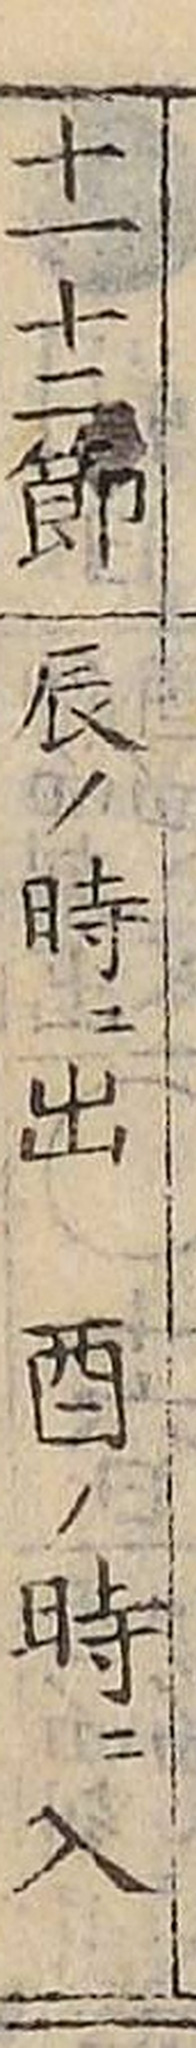十一十二節辰ノ時出酉ノ時入
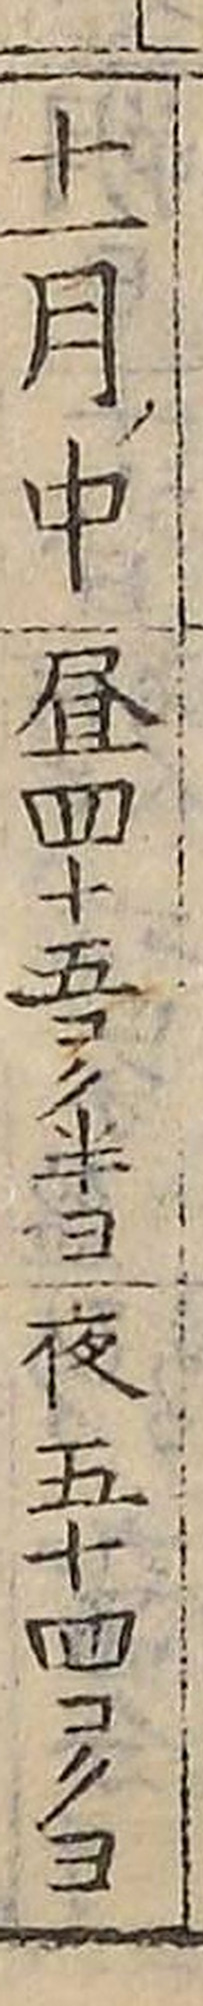十一月中昼四十五コク半ヨ夜五十四コクヨ
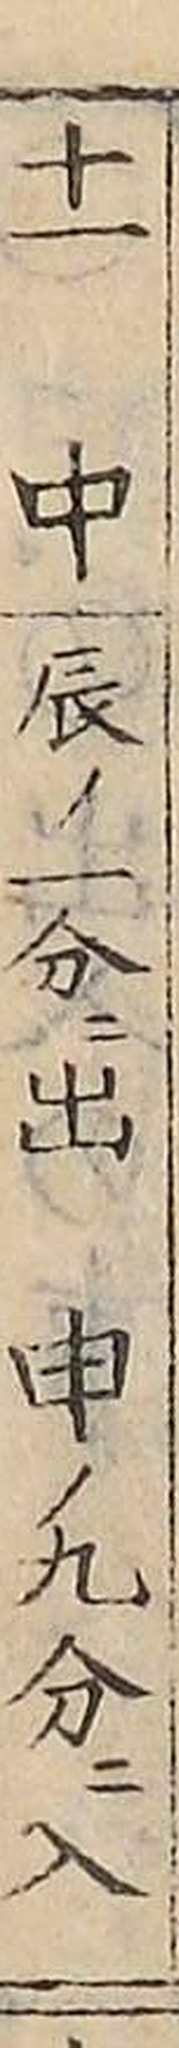十一中辰ノ一分出申ノ九分入
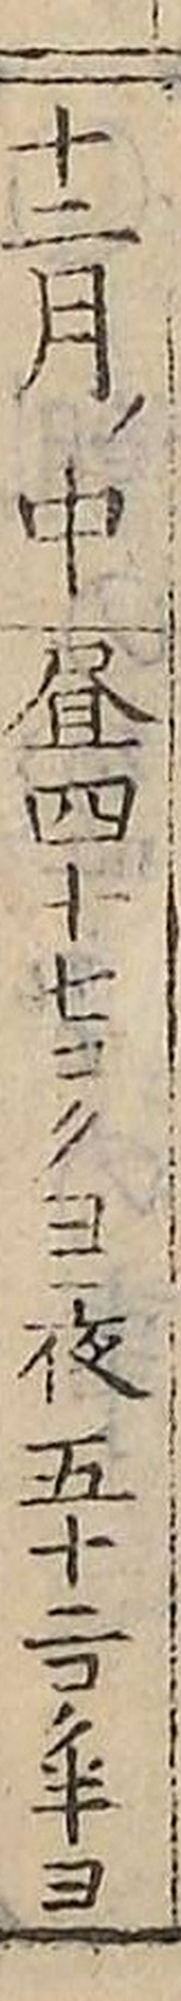十二月中昼四十七コクヨ夜五十二コク半ヨ

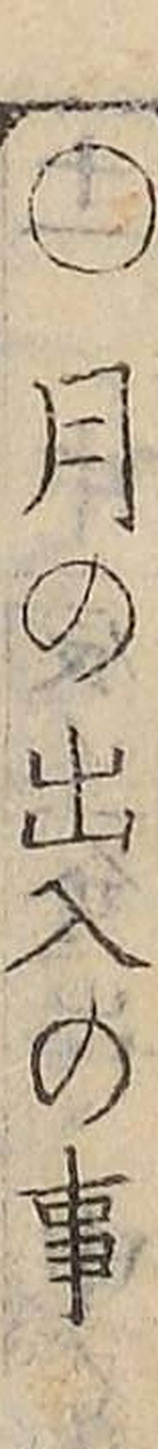○月の出入の事
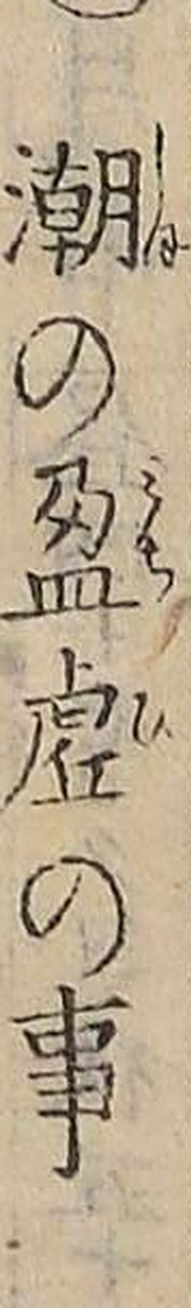○潮の盈虚の事
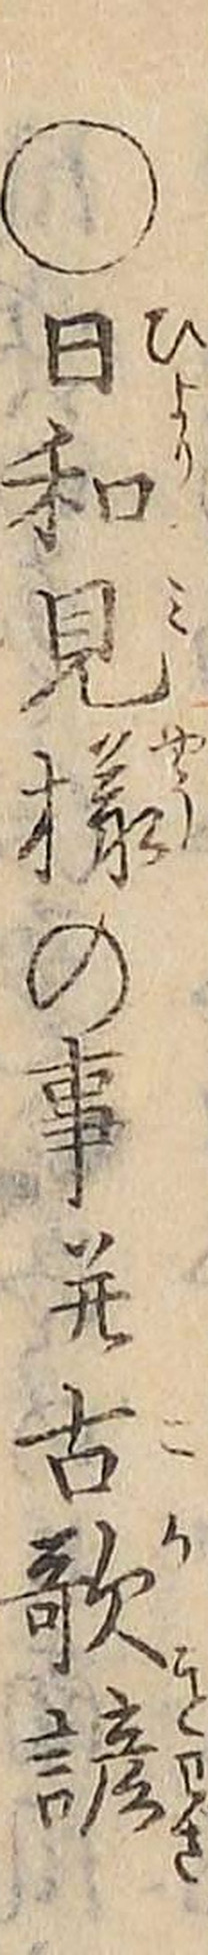〇日和見様の事幷古歌諺
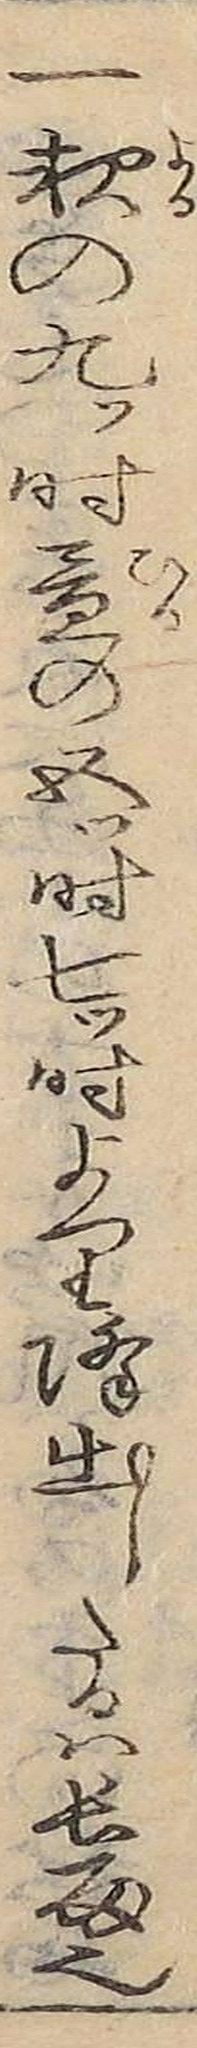一夜の九ッ時昼の五ッ時七ッ時より降出したるは長雨也
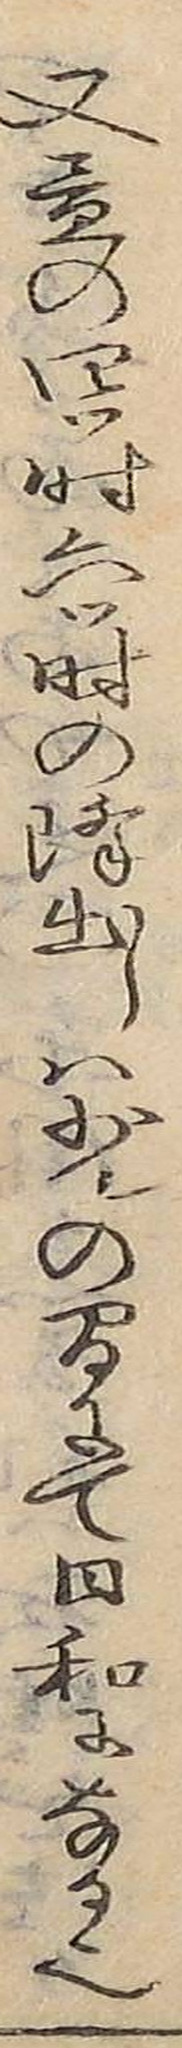又昼の四ッ時六ッ時の降出しは少しの間にて日和になる也
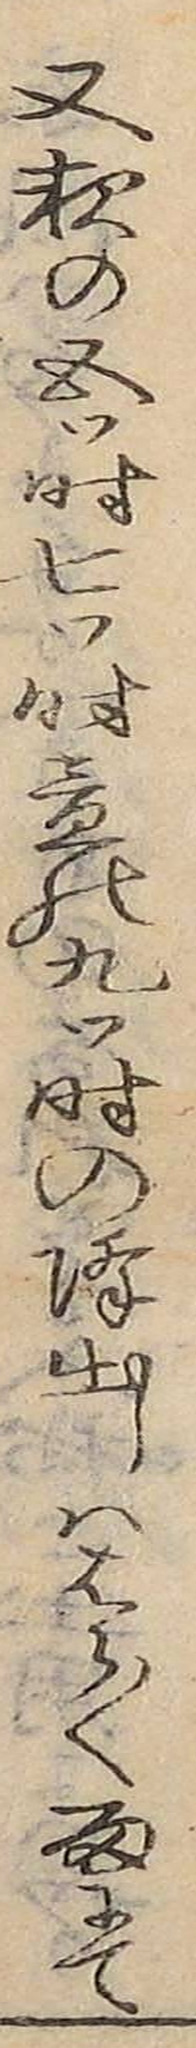又夜の五ッ時七ッ時昼の九ッ時の降出しははら〳〵雨にて
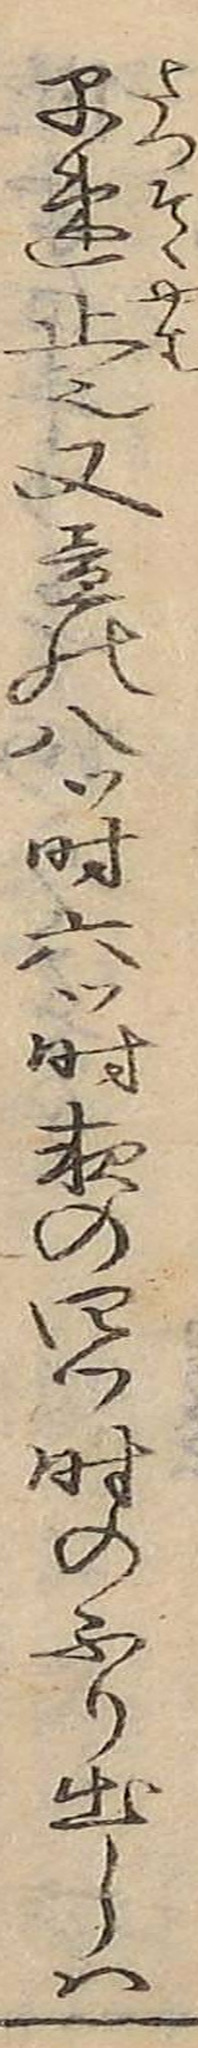早速止也又昼の八ッ時六ッ時夜の四ッ時のふり出しは

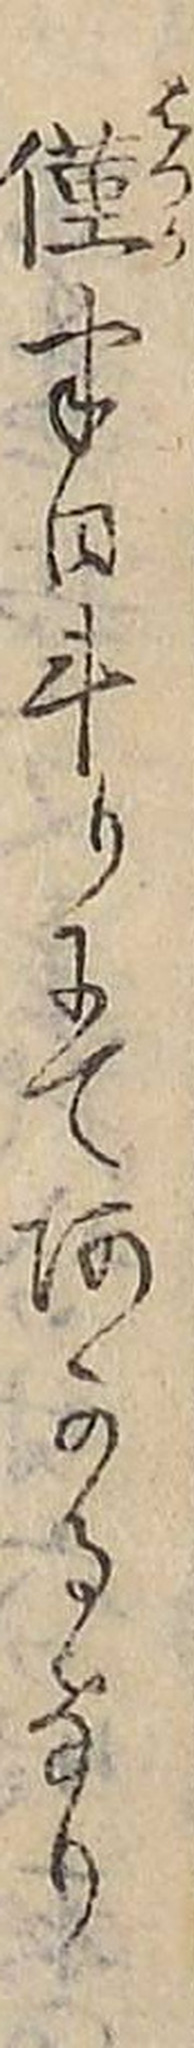僅半日計りにてあかるなり
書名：旅行用心集
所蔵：神戸大学附属図書館 国文学研究資料館
